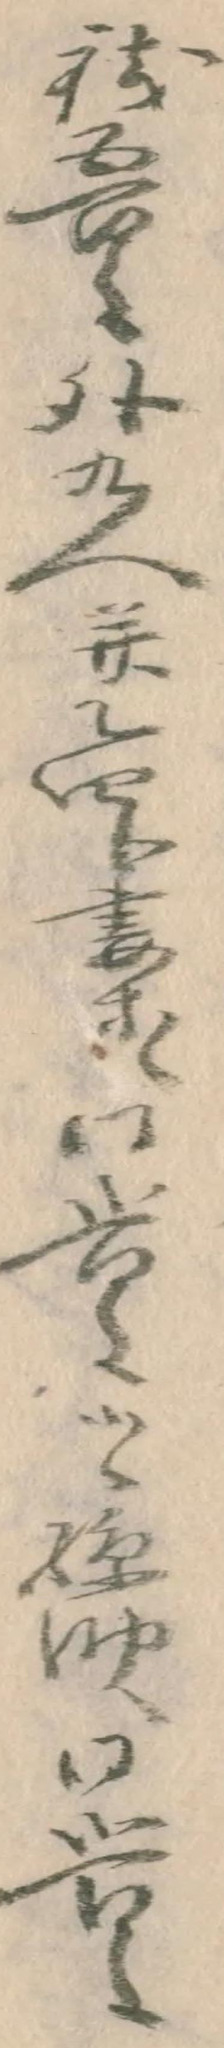銭五百文外九人并乙四郎妻等も同弐百文ツヽ孫助へ同弐百文
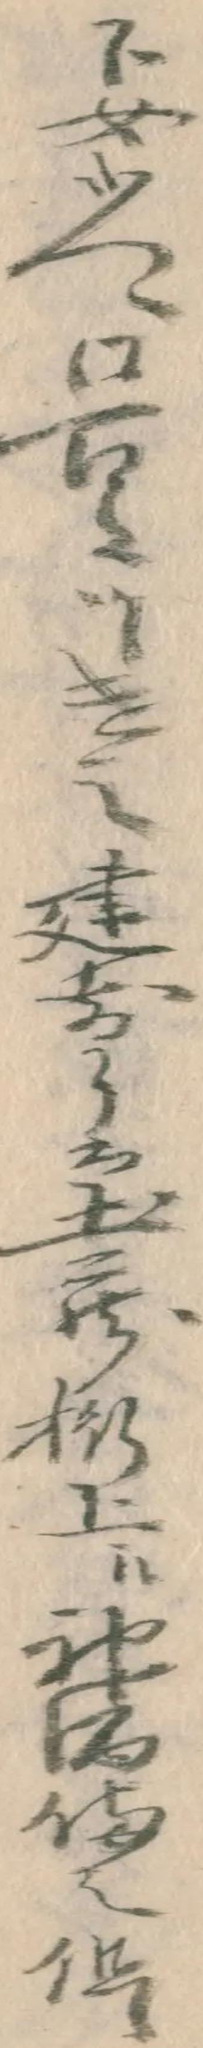下女弐人へ同百文ツヽ遣之建前了而土蔵桁上ル神酒備之但し
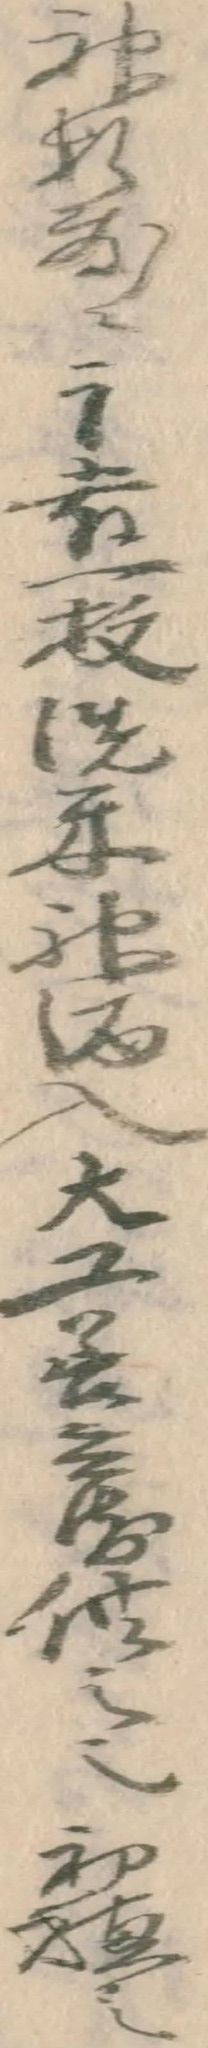神棚前ニ干肴一枚洗米神酒入大工善兵衛供之也初穂之
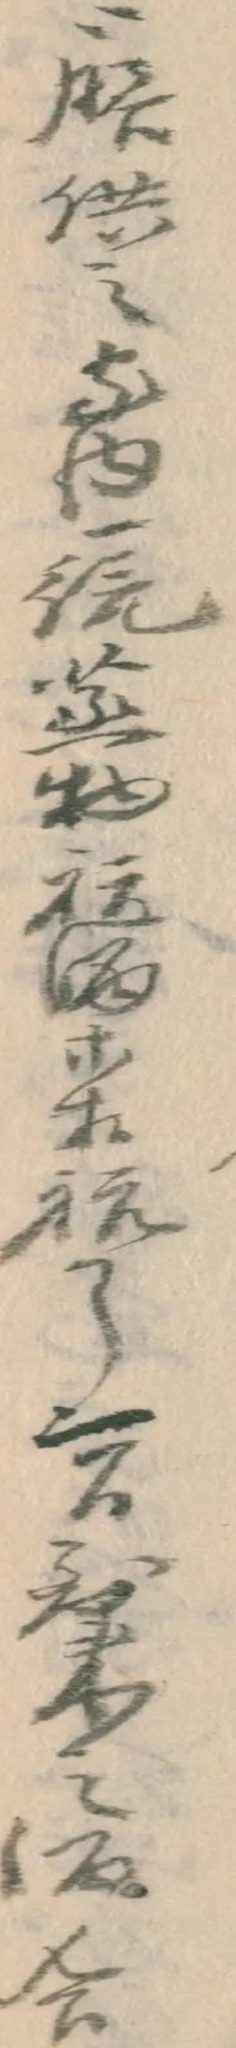御膳供之家内一統蒸物祝酒等相祝了今日到来之酒合
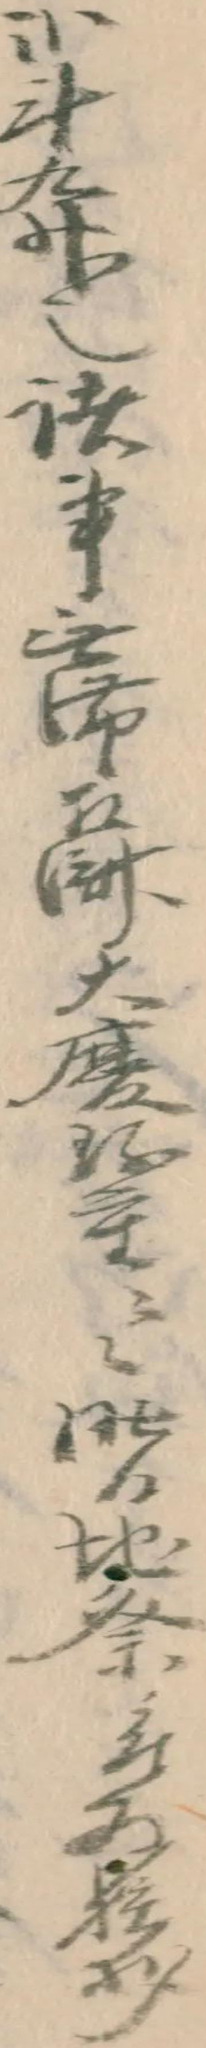弐斗九升也諸事無滞相済大慶珍重云々昨日地祭并為挨拶
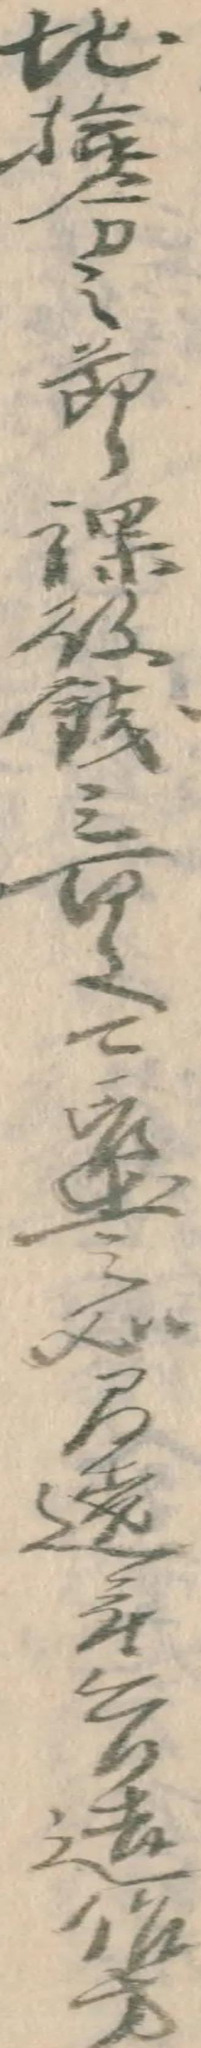地検分之節課役銭三百文可差出之処間違ニ付今日造作方
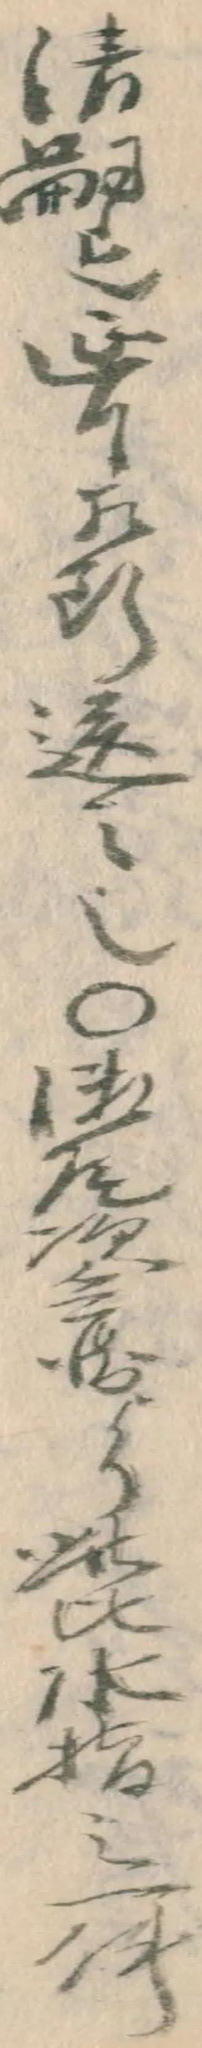清嗣迄延引相断送之也○瀬尾次兵衛より此比水指之一件
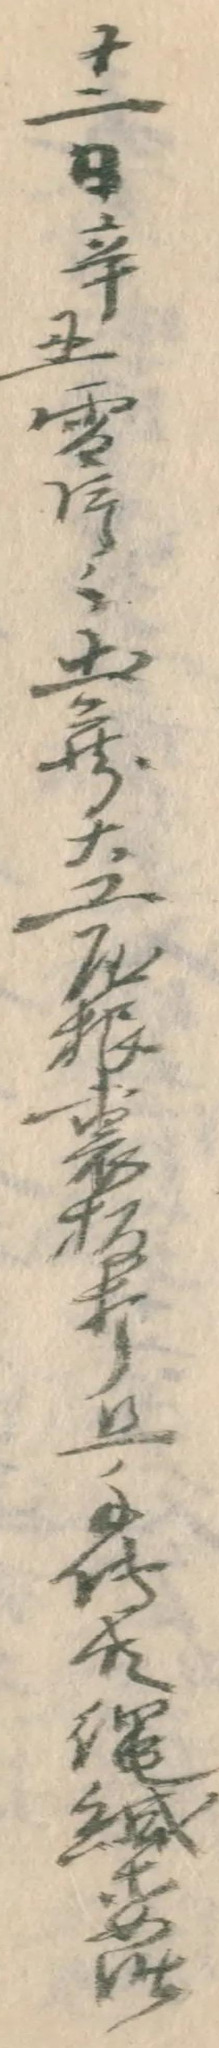十二日辛丑雪片土蔵大工屋根裏板打且手傳共縄織等如此
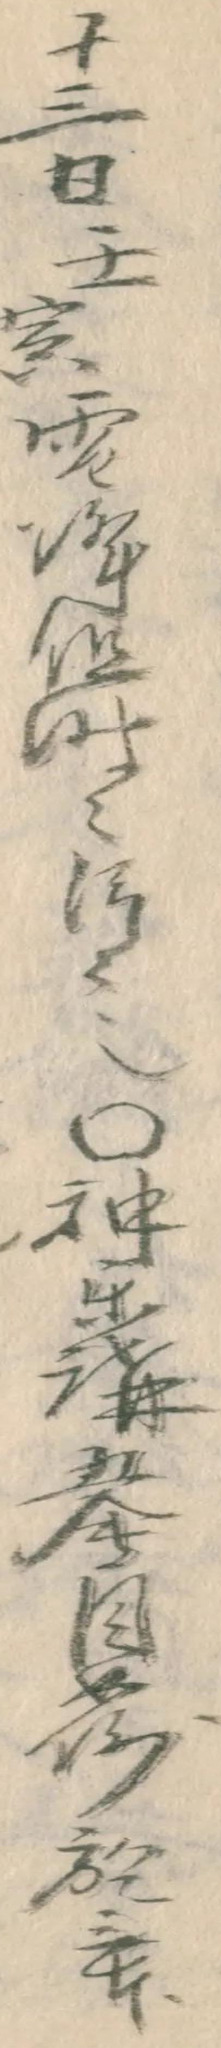十三日壬寅降但時々清々也〇神楽講五會目如何於三本
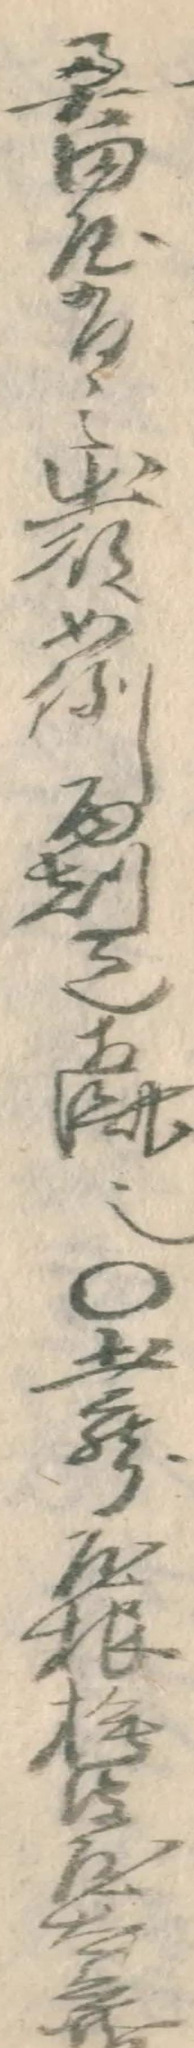奥田屋有之出役如例酉刻過相済之〇土蔵屋根檜皮屋太蔵
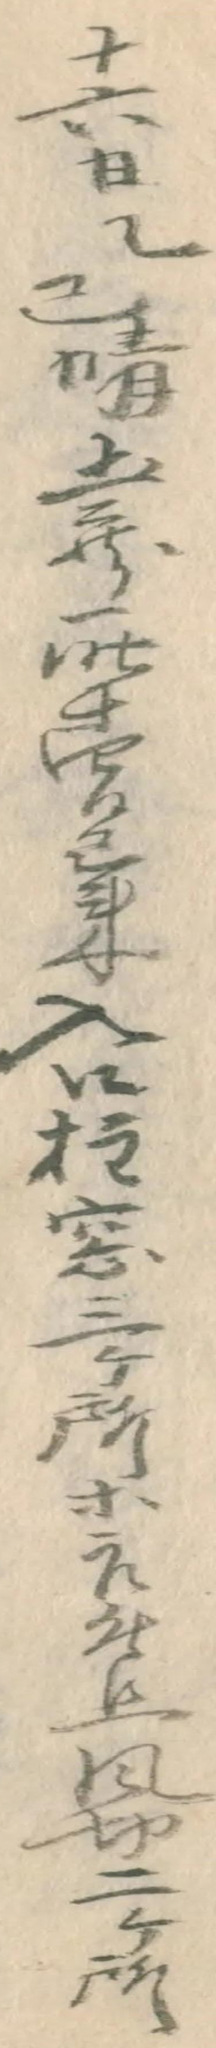十六日乙巳晴土蔵一昨十四日出来入口柱窓三ヶ所等取付且風切二ヶ所
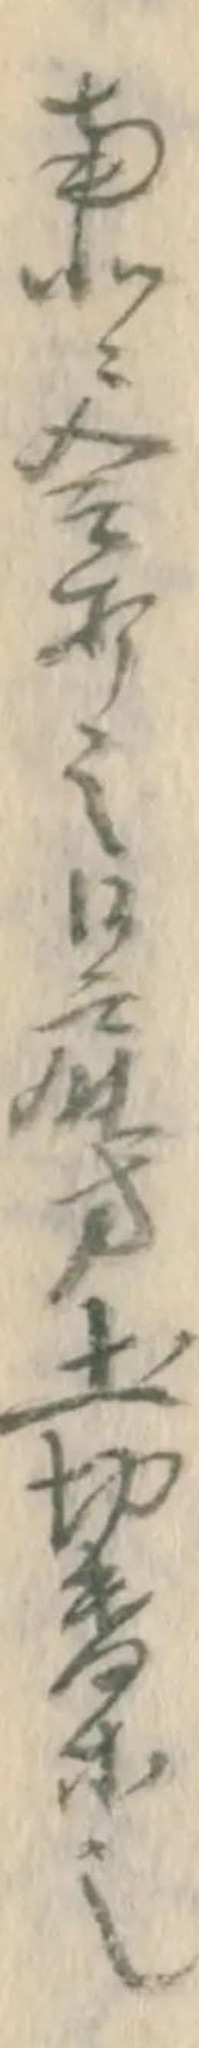南北に令打之日雇方土切替等之

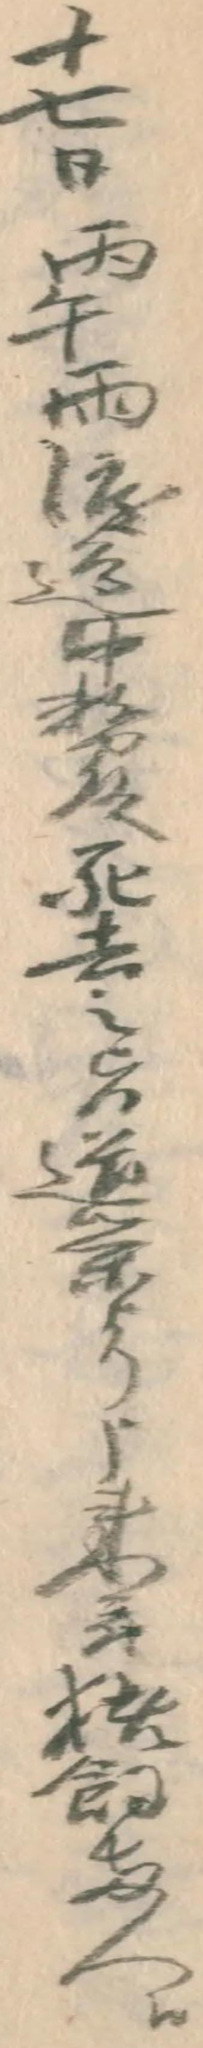十七日丙午雨渡邊中務殿死去之旨道栄より申来ニ付猪飼両人え
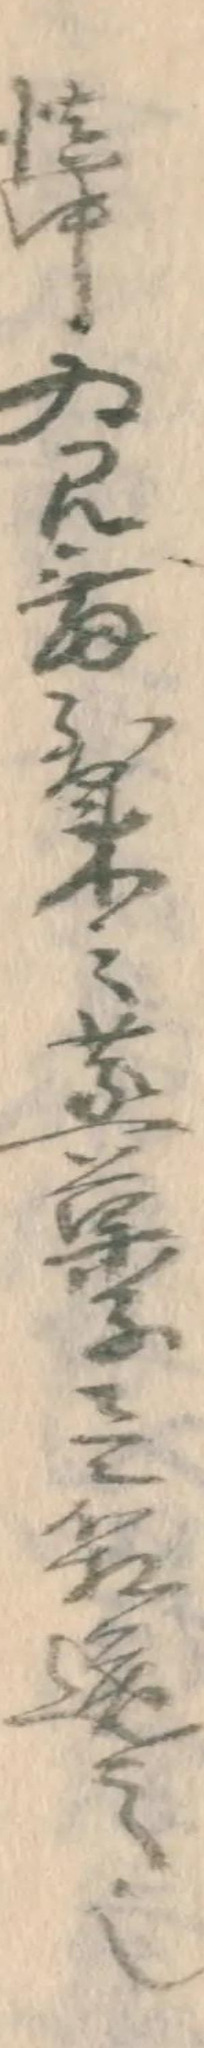悔中為見舞到来之蒸菓子壱箱送之也
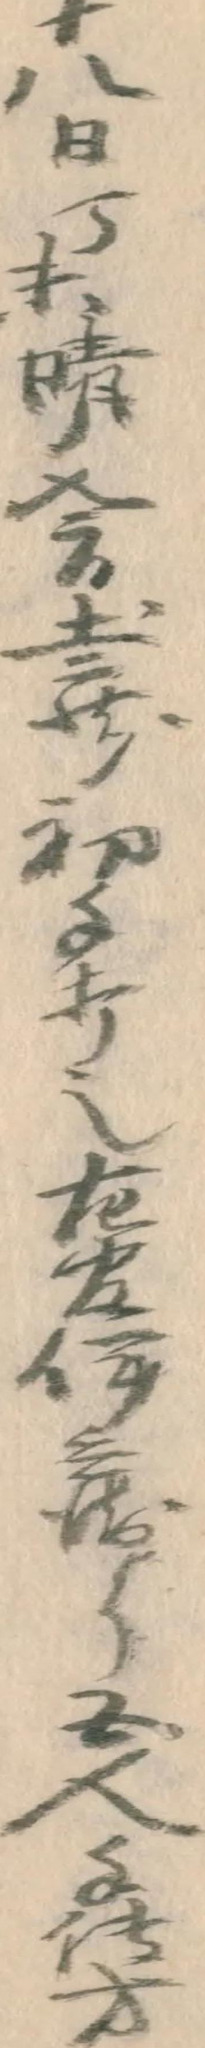十八日丁未晴今日土蔵初手打也左官伊兵衛より五人手傳方
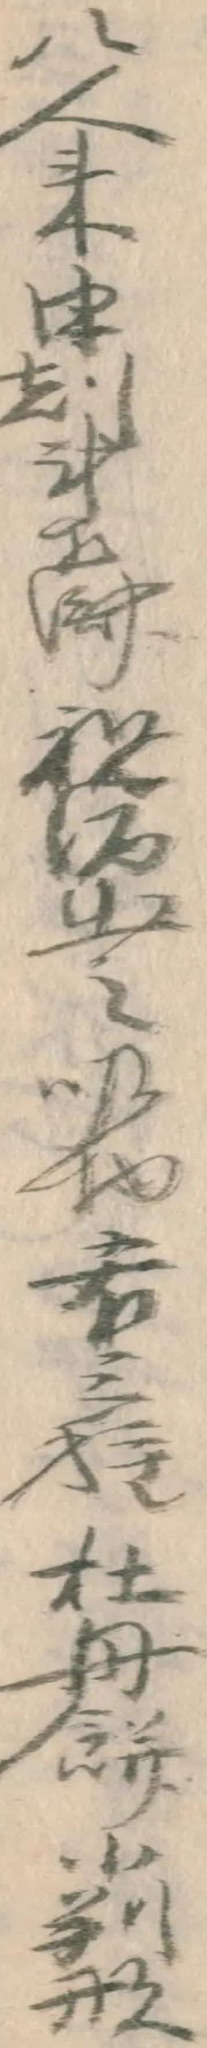八人来申刻斗相済祝酒出之吸物肴三種牡丹餅小判形
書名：賀茂社記録. 第67冊
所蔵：国立国会図書館 National Diet Library, JAPAN
